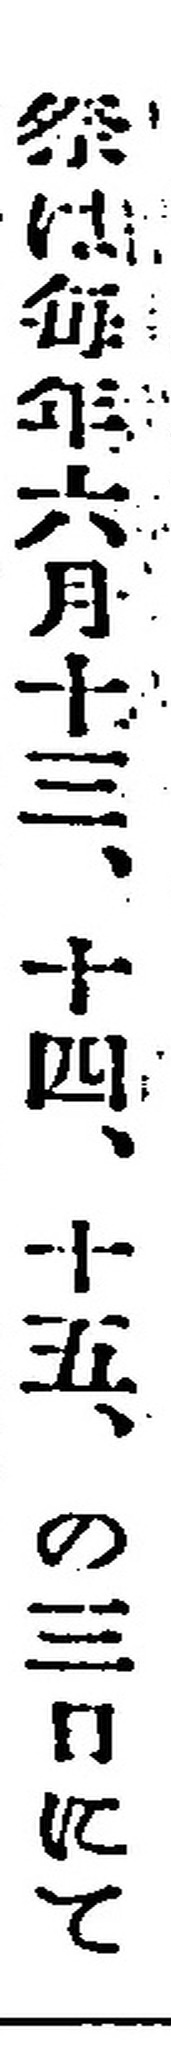祭は毎年六月十三、十四、十五、の三日にて
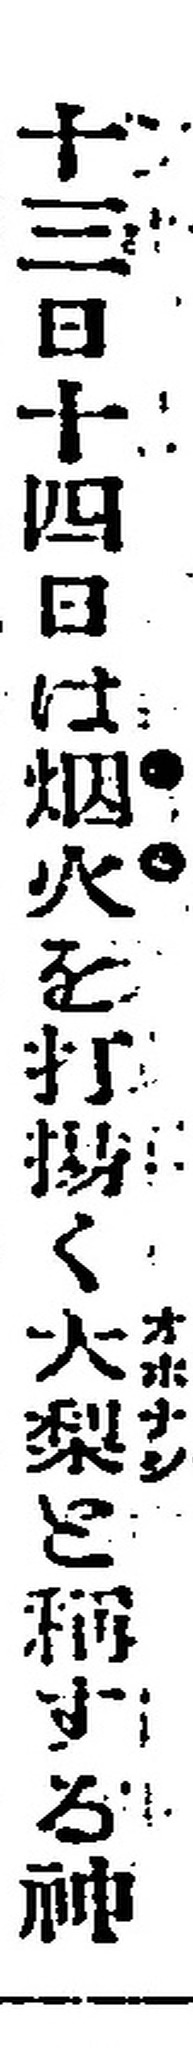十三日十四日は烟火を打揚ぐ大梨と称する神
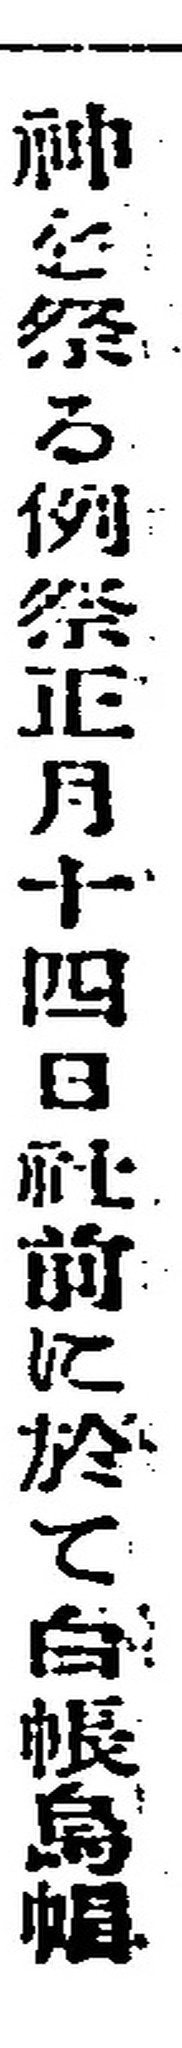神を祭る例祭正月十四日社前に於て白帳烏帽
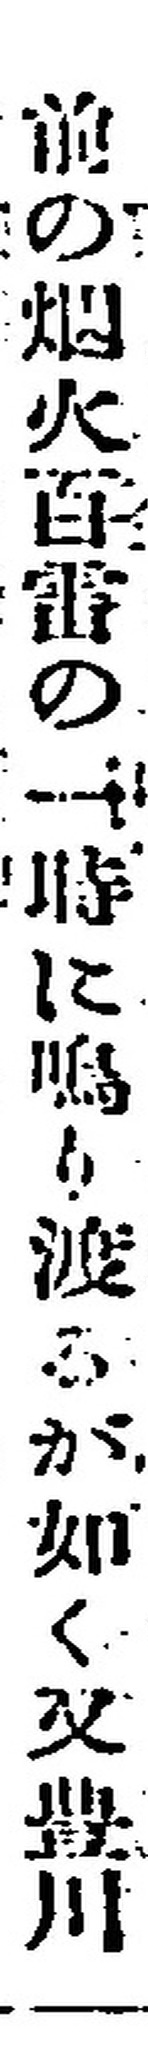前の烟火百雷の一時に鳴り渡るが如く又豊川
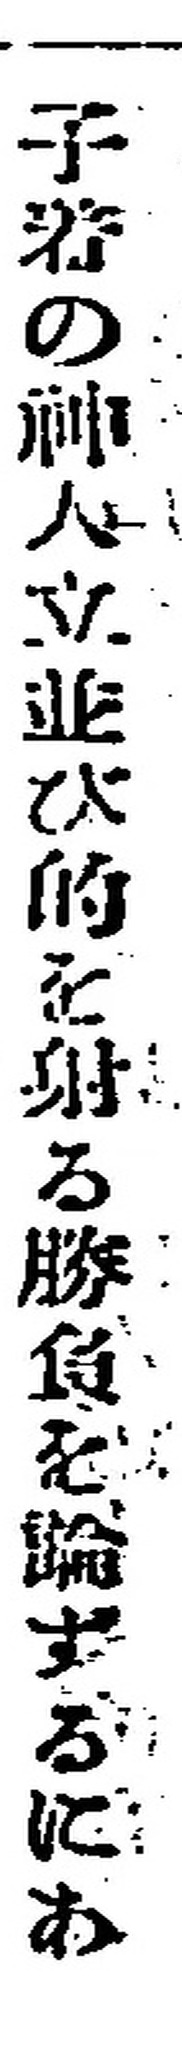子着の神人立並び的を射る勝負を論ずるにあ
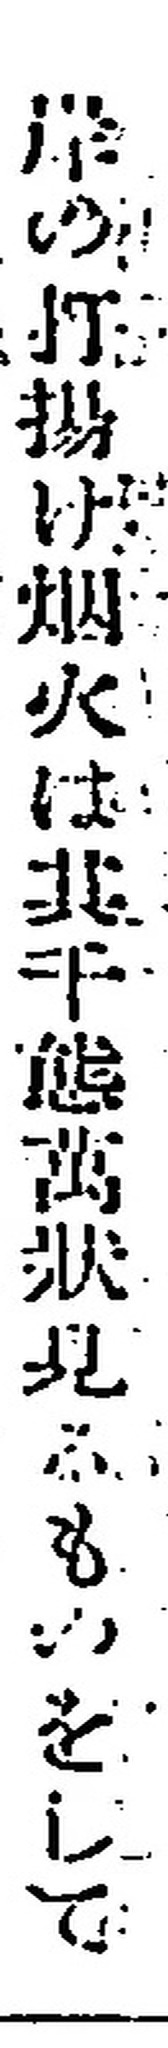岸の打揚げ烟火は其千態万状見るものをして
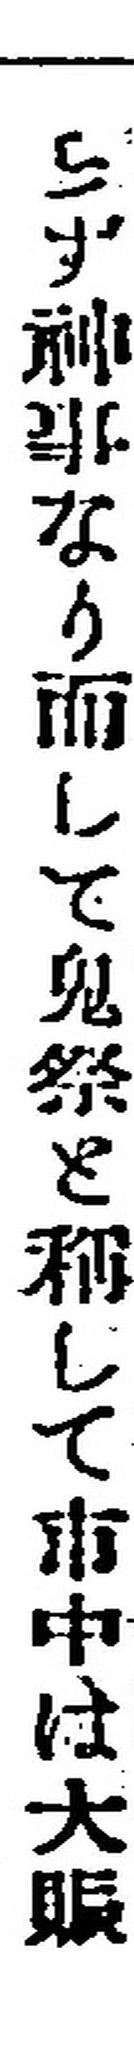らず神事なり而して鬼祭と称して市中は大賑
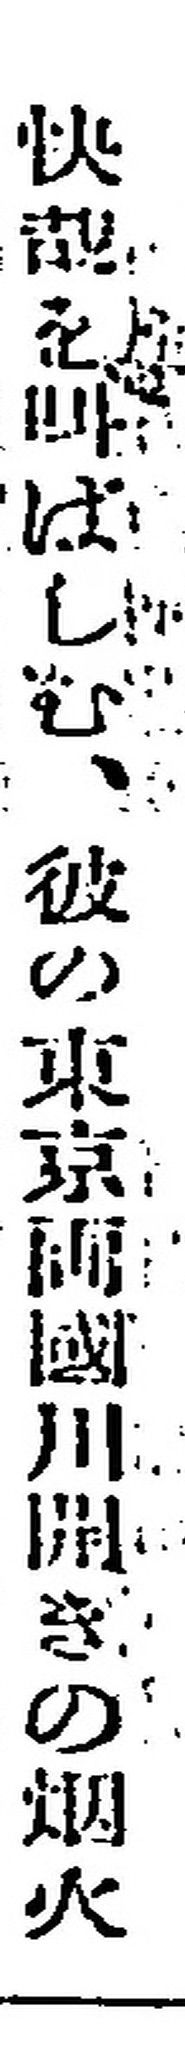快哉を叫ばしむ、彼の東京両国川開きの烟火
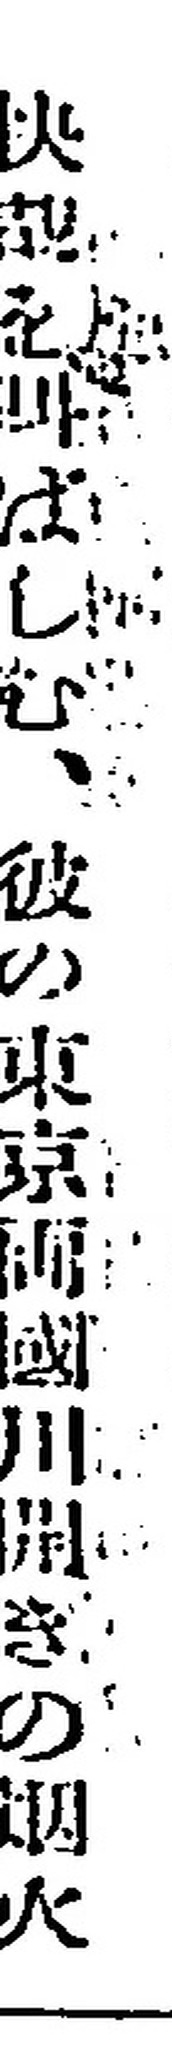快哉を叫ばしむ、彼の東京両国川開きの烟火
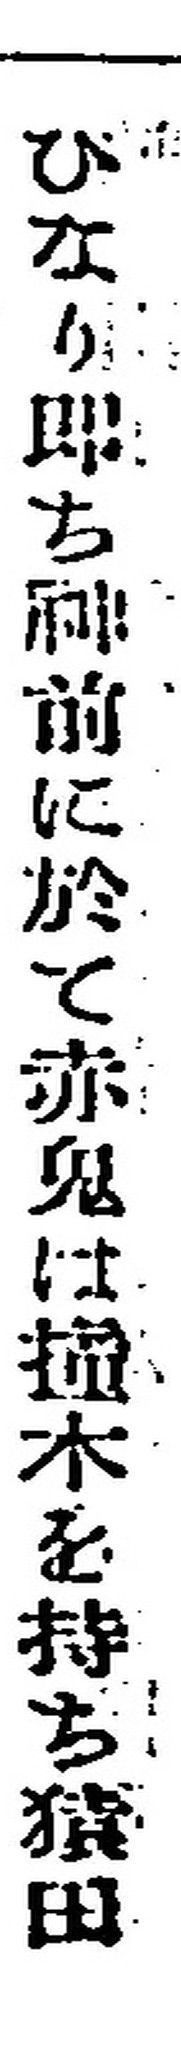ひなり即ち神前に於て赤鬼は撞木を持ち猿田
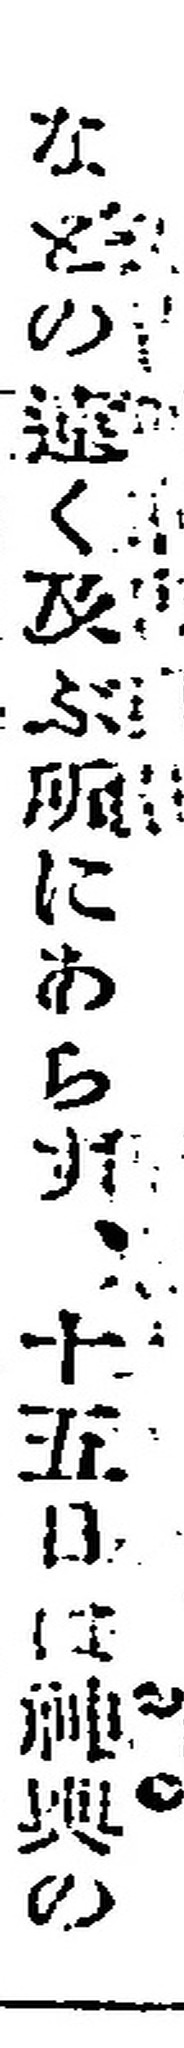などの遠く及ぶ所にあらず、十五日は神輿の
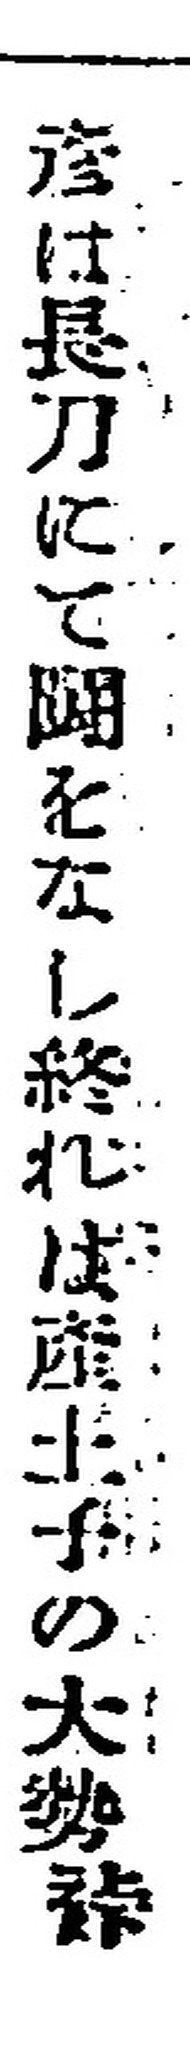彦は長刀にて闘をなし終れば産土子の大勢裃
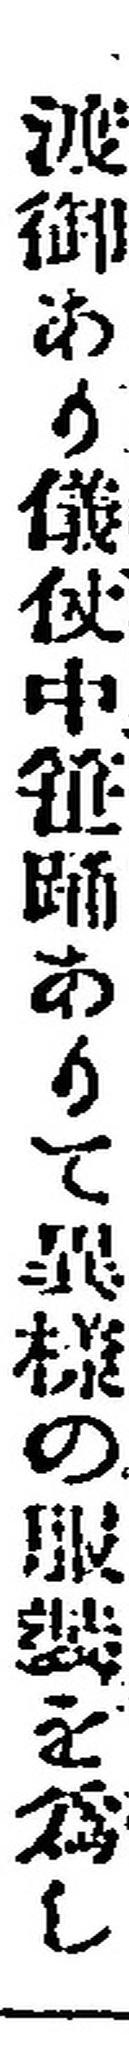渡御あり儀仗中笹踊ありて異様の服装を為し
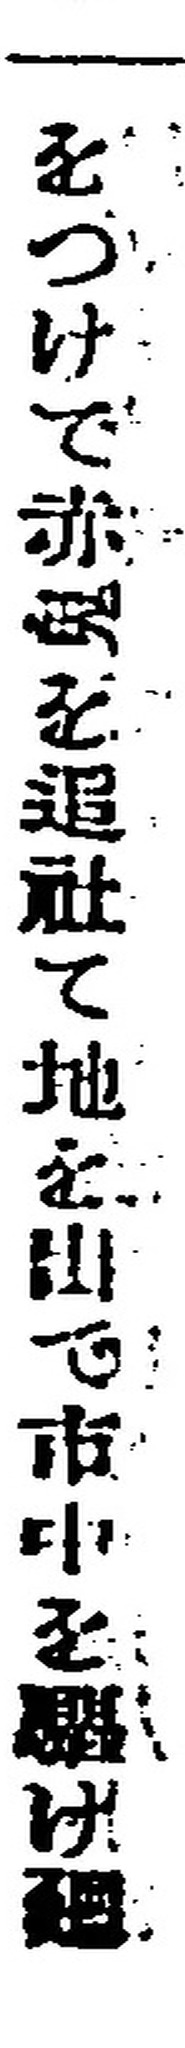をつけて赤鬼を追社て地を出で市中を駆け廻
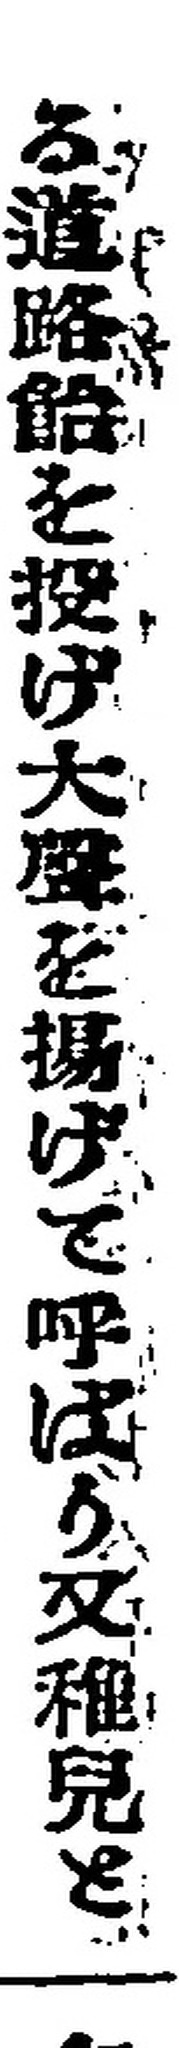る道路飴を投げ大声を揚げて呼ばり又稚児と
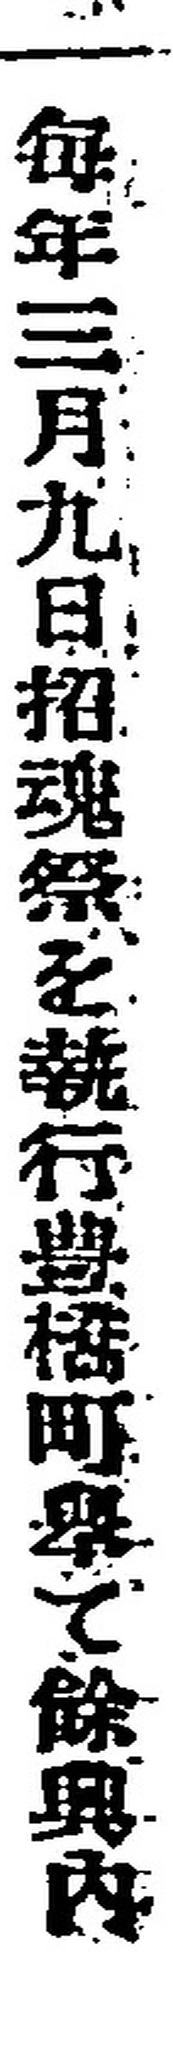毎年三月九日招魂祭を執行豊橋町挙て余興内
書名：東参名勝案内
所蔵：国立国会図書館 National Diet Library, JAPAN
